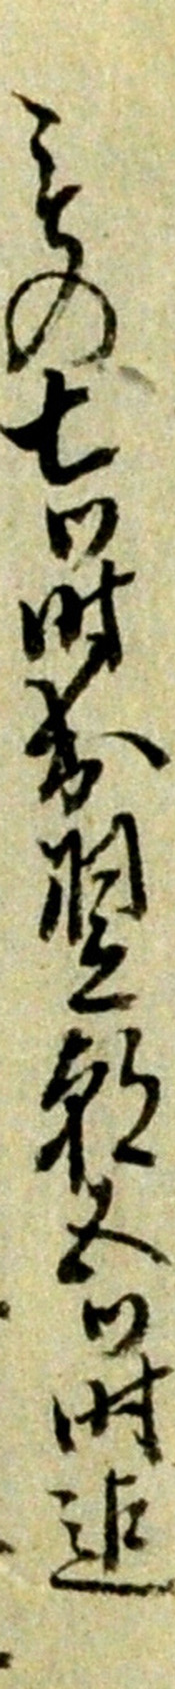もの七ツ時出翌朝五ツ時迄
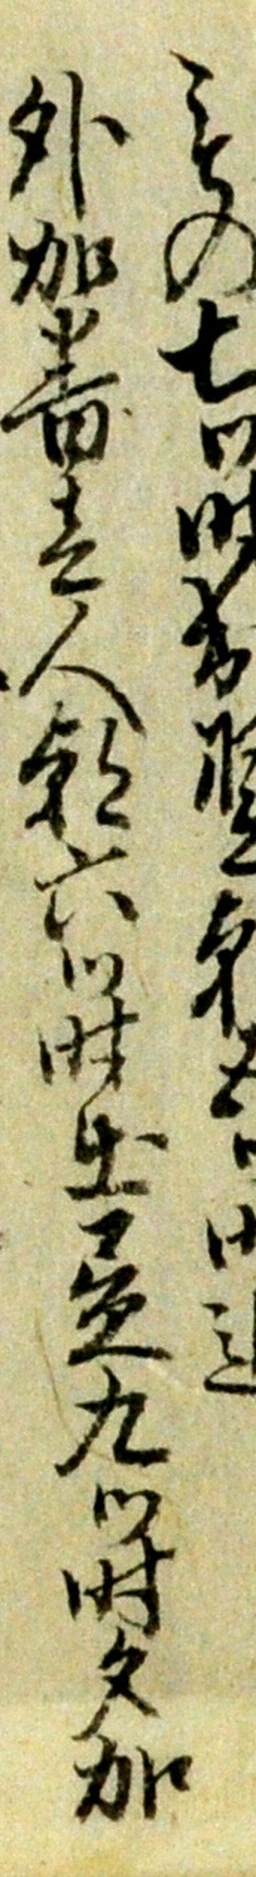外加番壱人朝六ツ時出昼九ツ時夕加
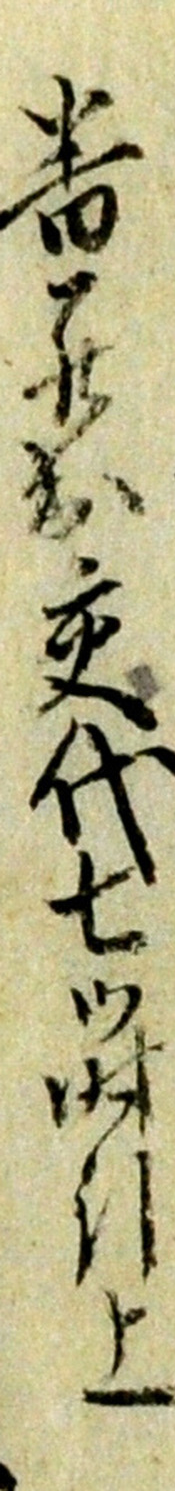番罷出交代七ツ時引上
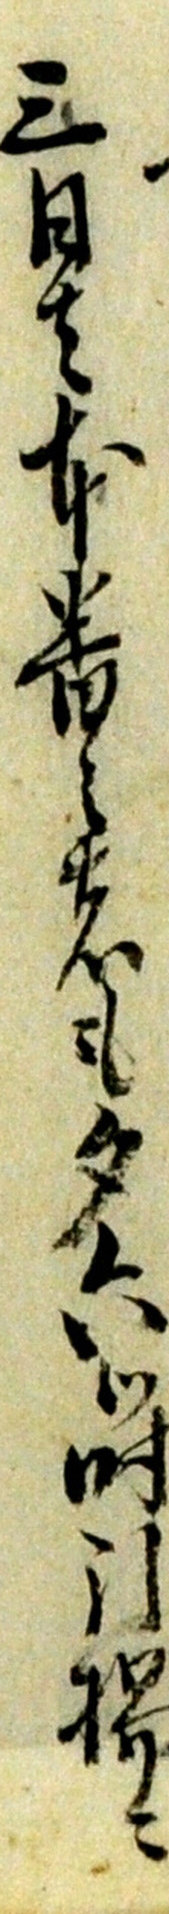三日者本番之者も夕六ツ時引揚ニ
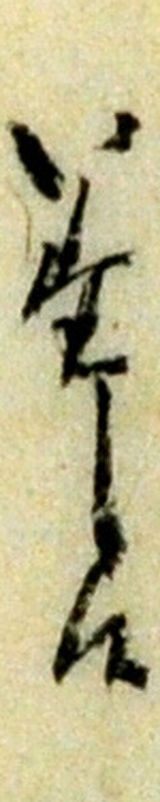いたし候
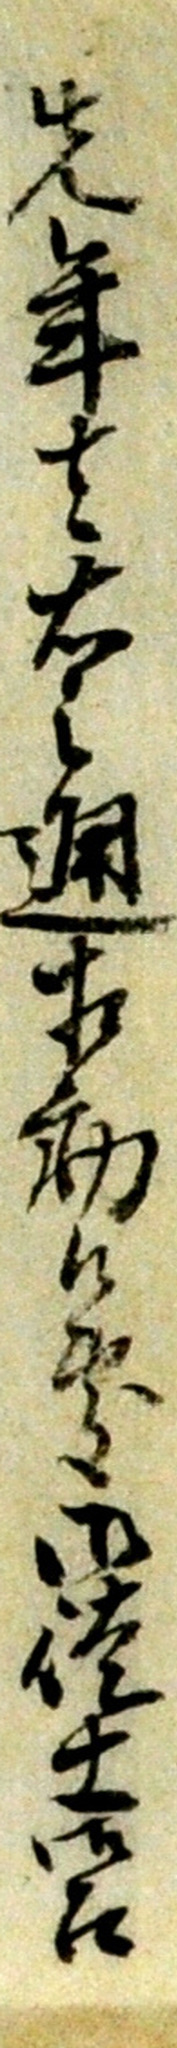先年者右之通相勤候処御徒士御召
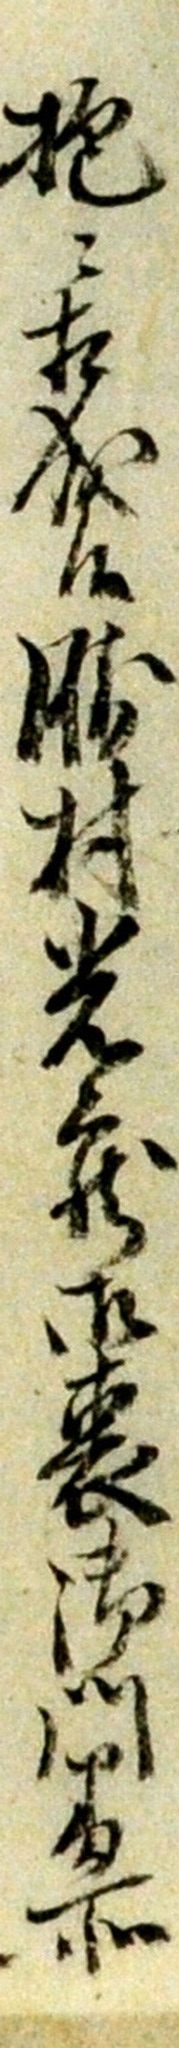抱ニ相成候勝村光蔵御裏御門番所
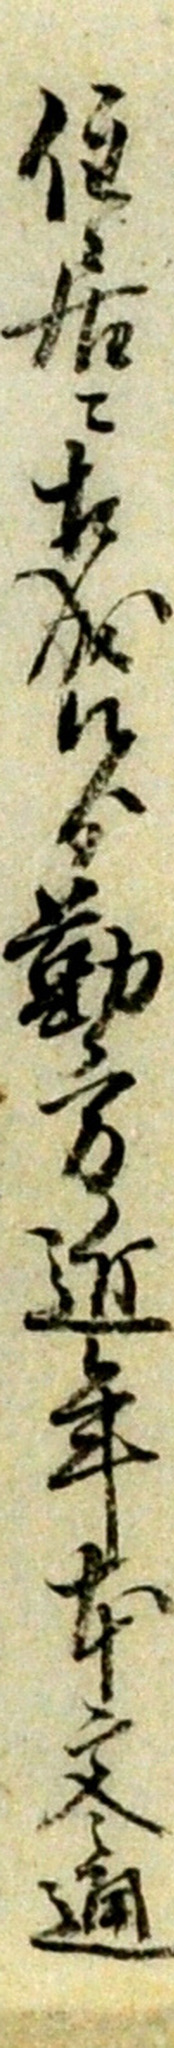住居ニ相成候ゟ勤方近年本文之通
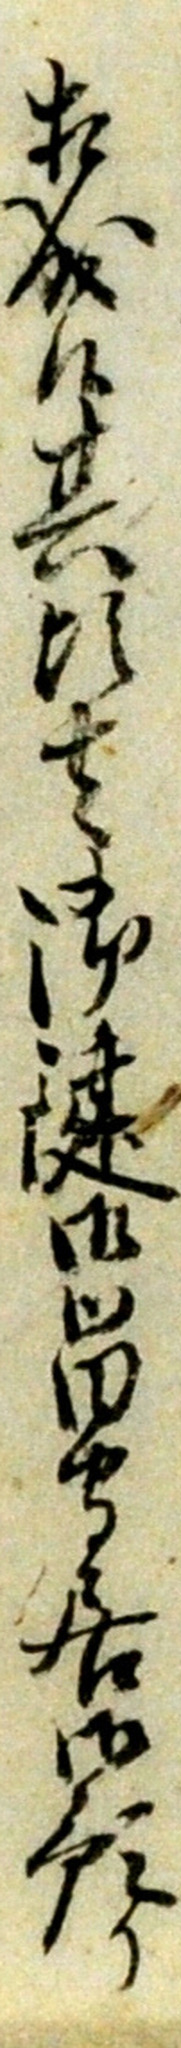相成候其頃者御鍵御留守居御預り
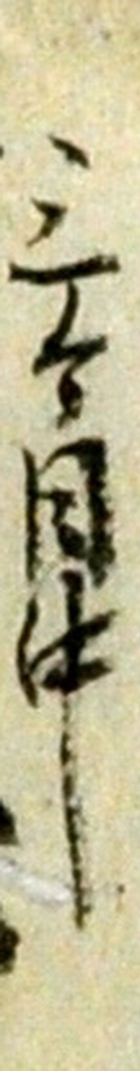三ヶ日中
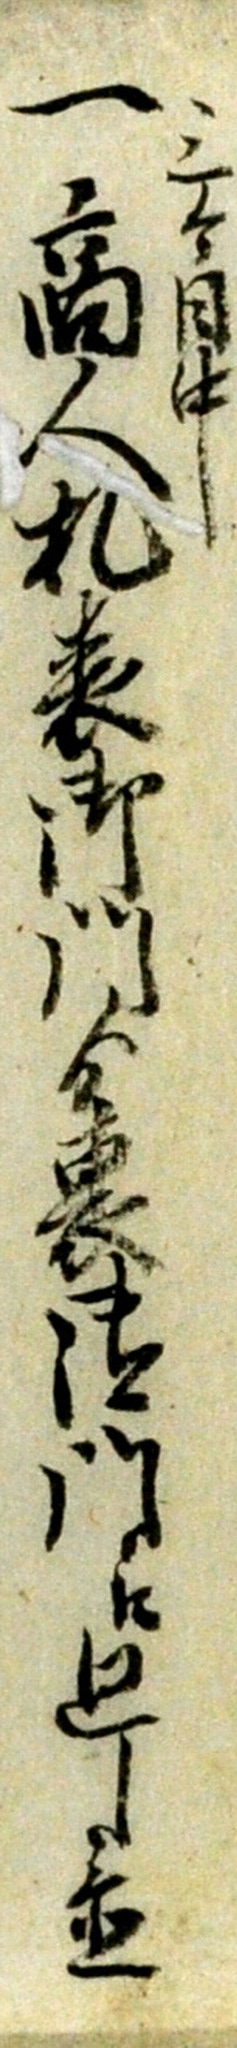一商人札表御門ゟ裏御門江廻し置
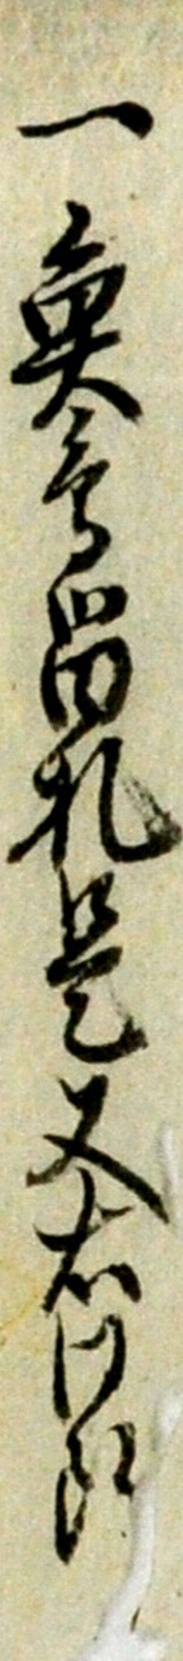一魚鳥留札是又右同断
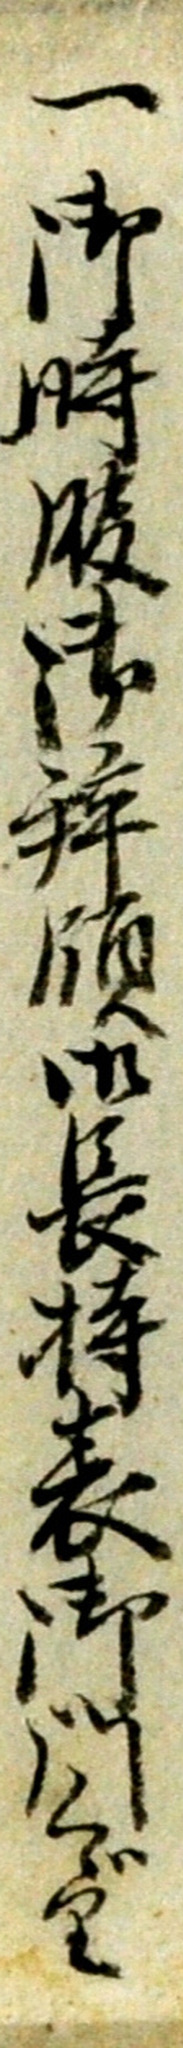一御時服御拝領御長持表御門くぐり
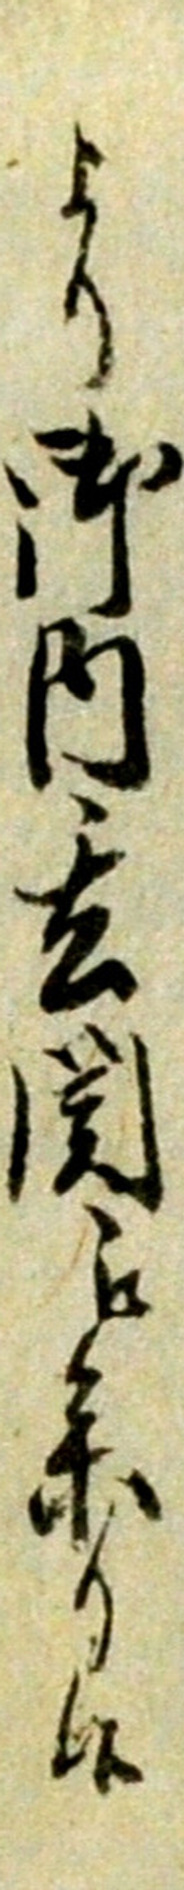より御内玄関江参り候
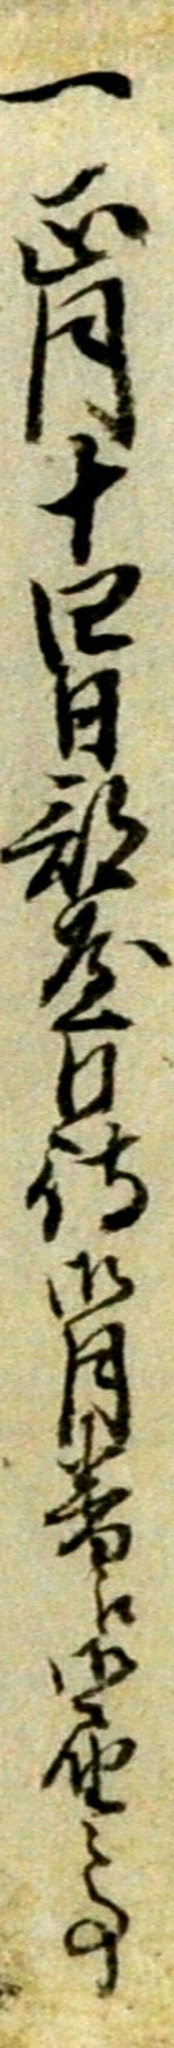一正月十四日部屋日待御月番江御届之事
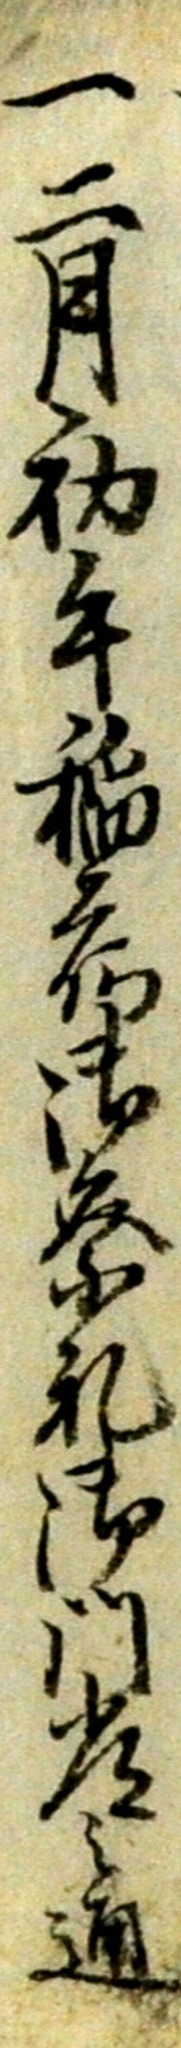一二月初午稲荷御祭礼御門常之通
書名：御先手組江戸御屋敷御門番勤方
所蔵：伊那市立高遠町図書館・合同会社AMANE
